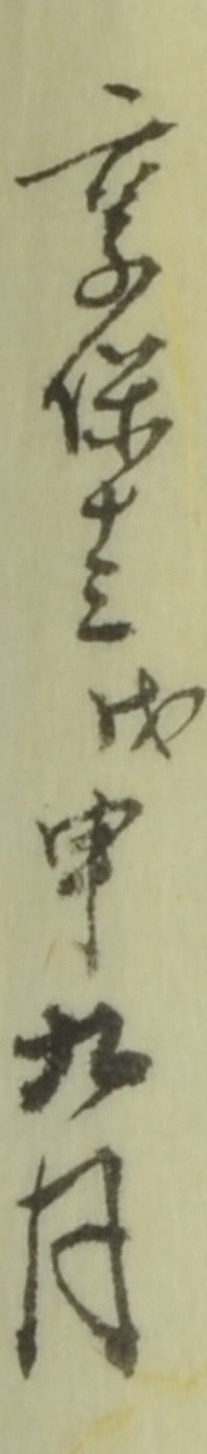享保十三戌申九月

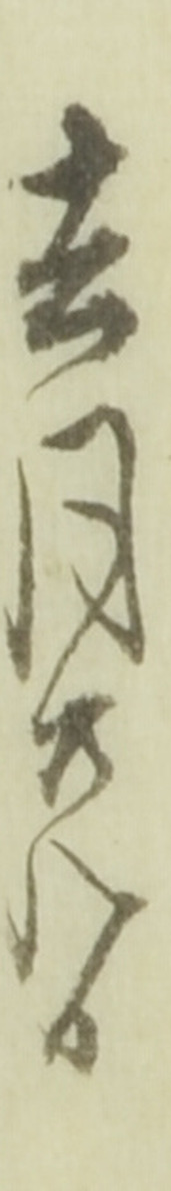去月廿八日
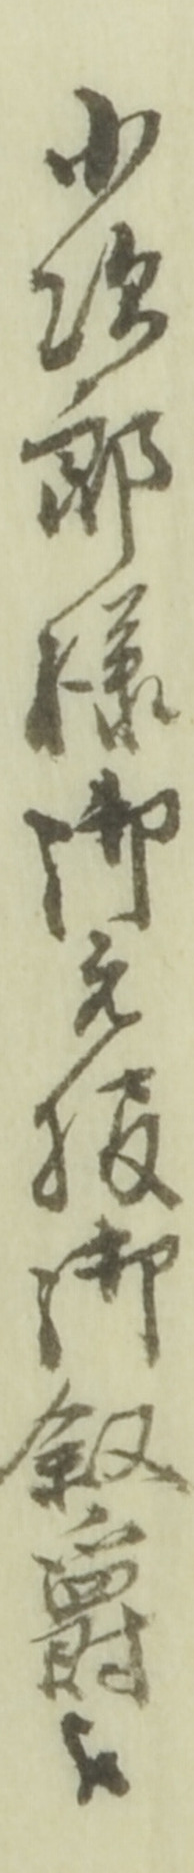小次郎様御元服御叙爵被
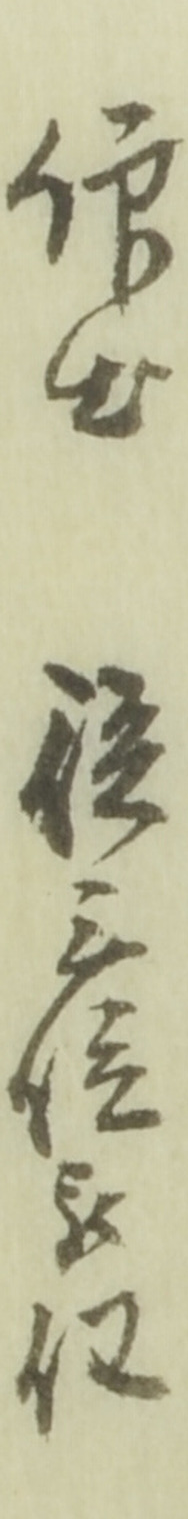仰出従三位被任
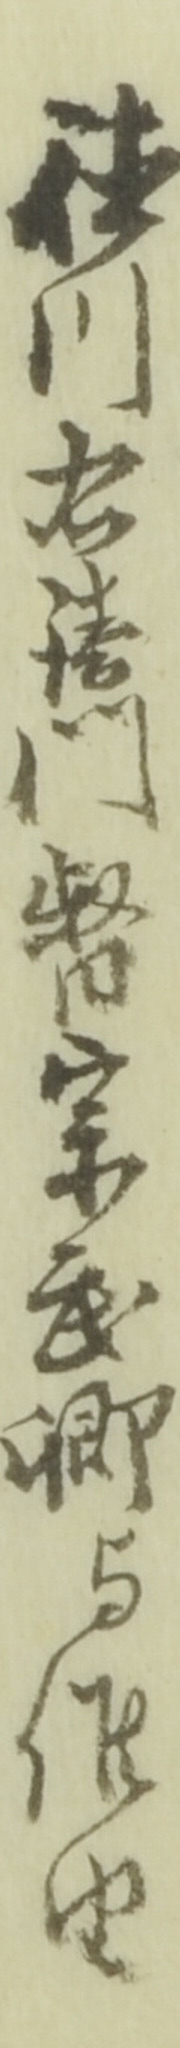徳川忠衛門督宗武卿と
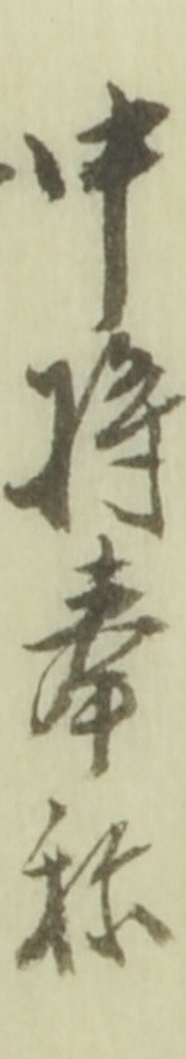中将奉禄
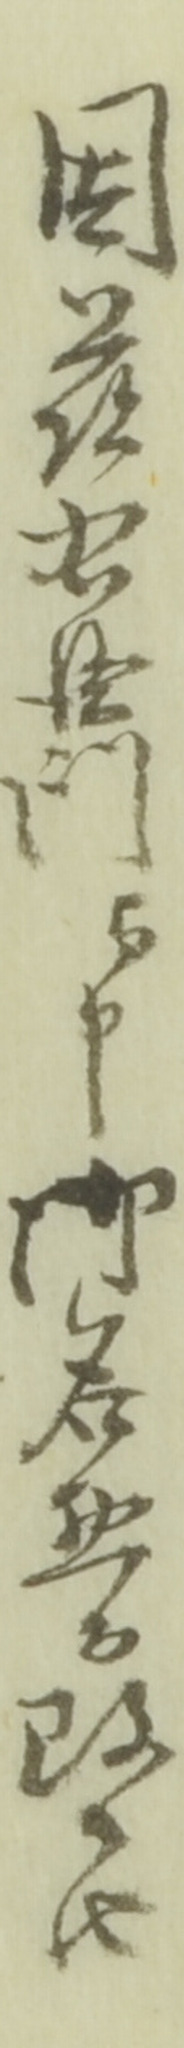周忠衛門と申御名惣而改候也
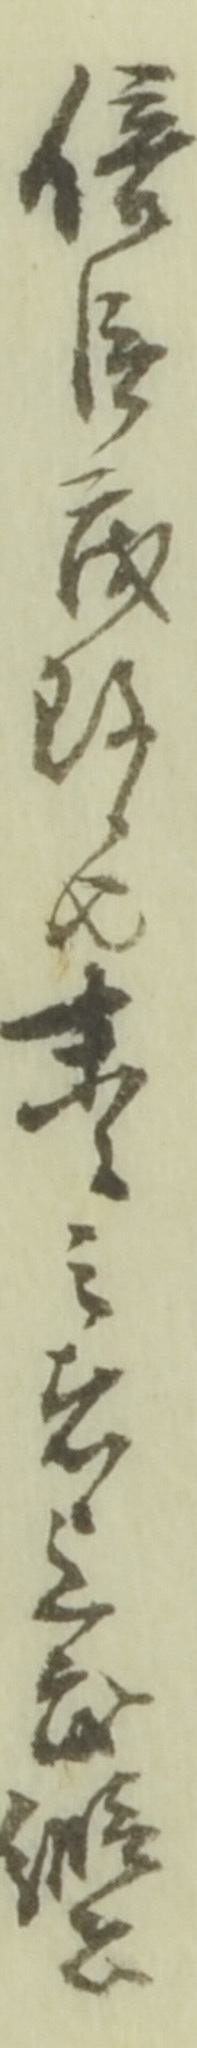陪臣茂改候也末々之者迄茂縦者
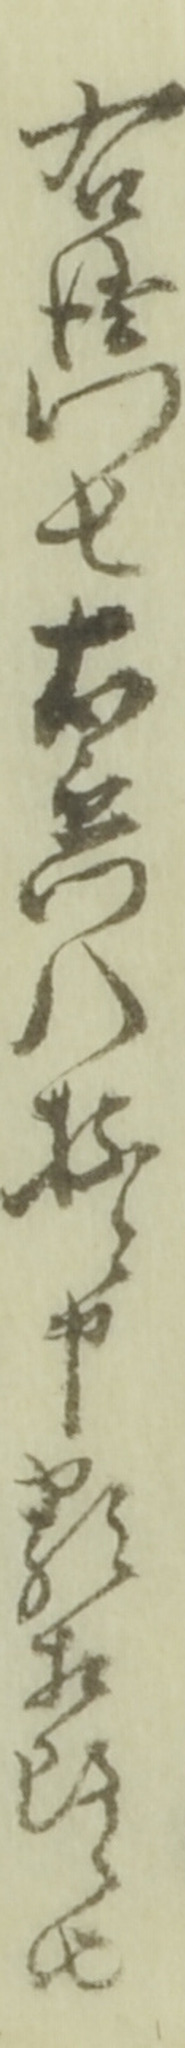右衛門七右衛門八様二申類相改候也
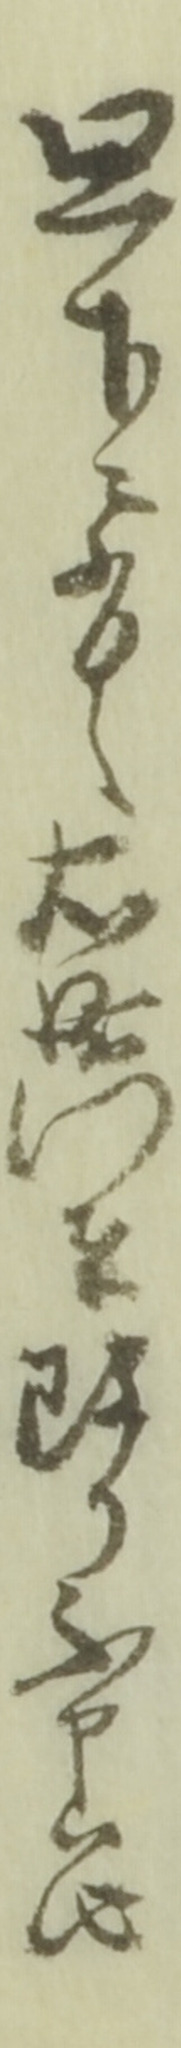且下々有之右衛門者改候不申止也
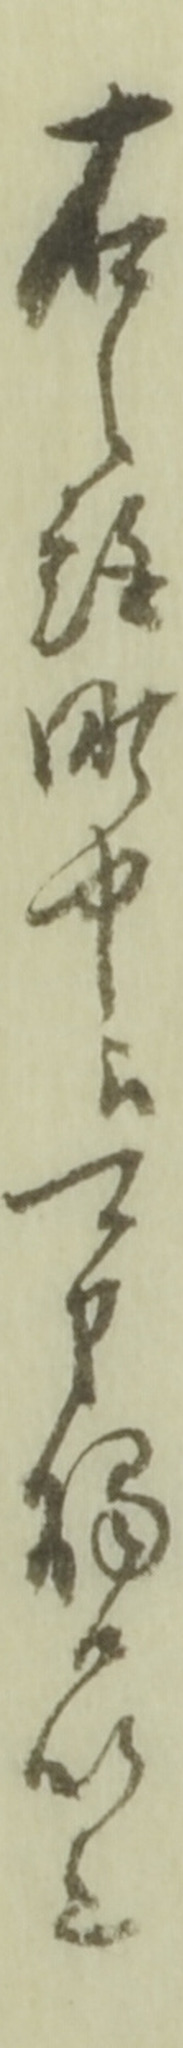右之趣町中へ可申触候以上
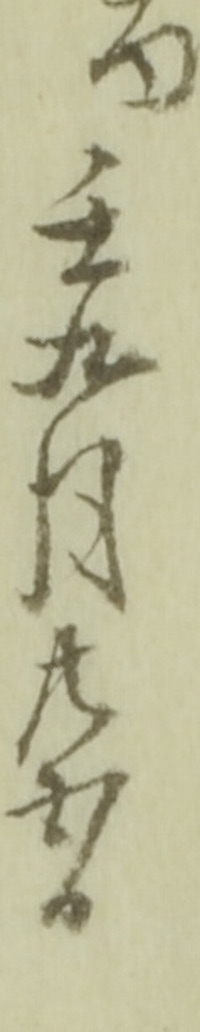酉壬九月廿五日
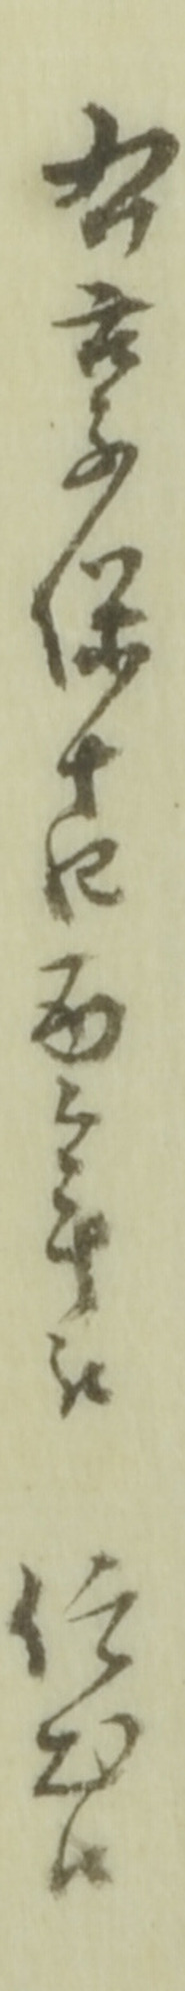右享保十四酉年被仰出候
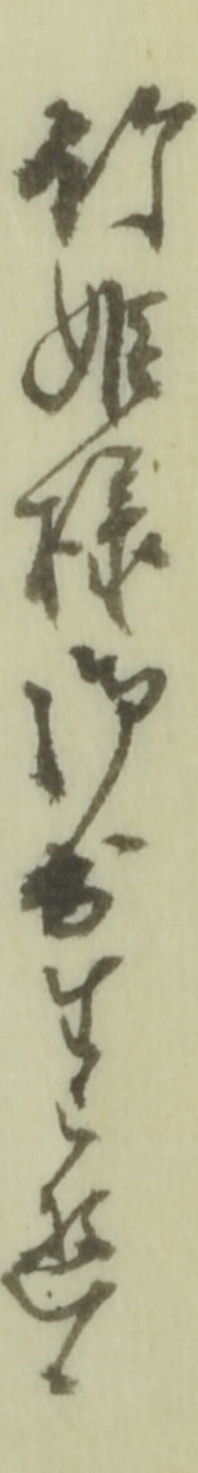竹姫様御出生被遊候
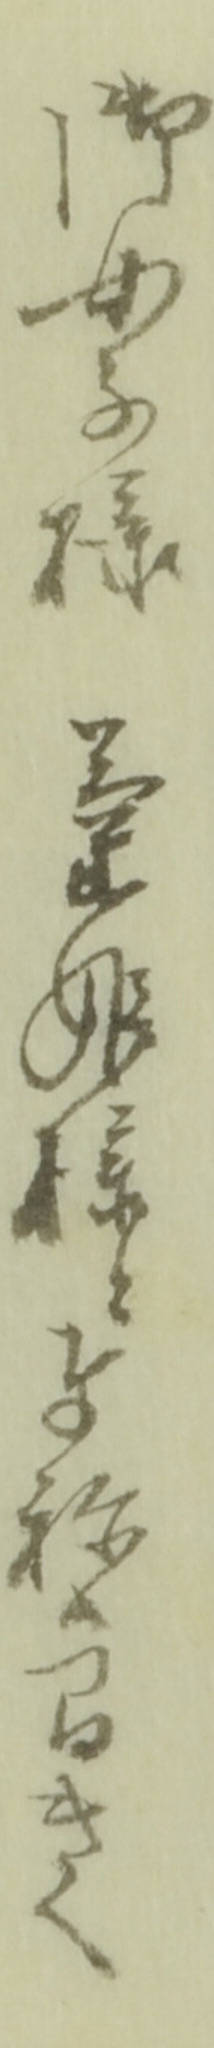御女子様菊姫様と奉称候間きく
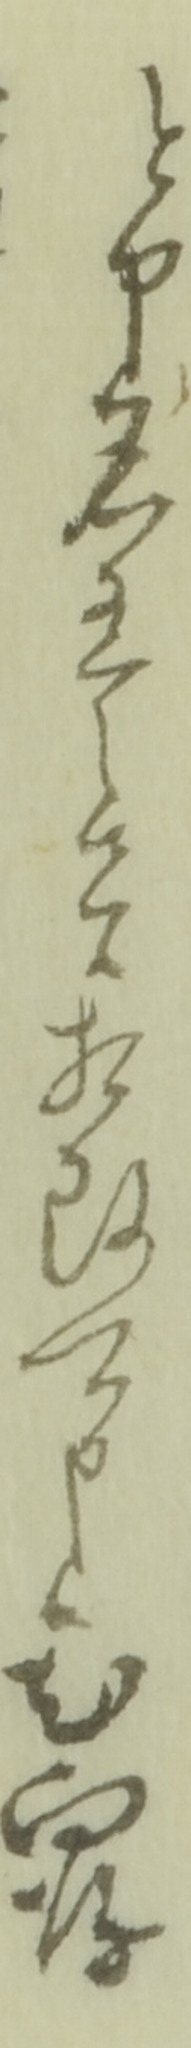と申名有之候者相改可申候尤向後
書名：御公儀様御領主様御触書控
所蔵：伊那市立高遠町図書館・合同会社AMANE
